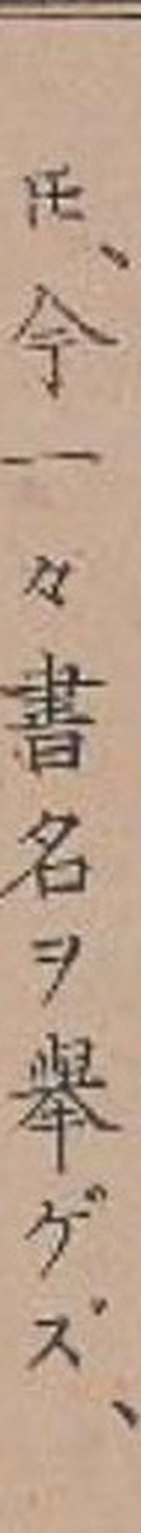トモ、今一々書名ヲ挙ゲズ、
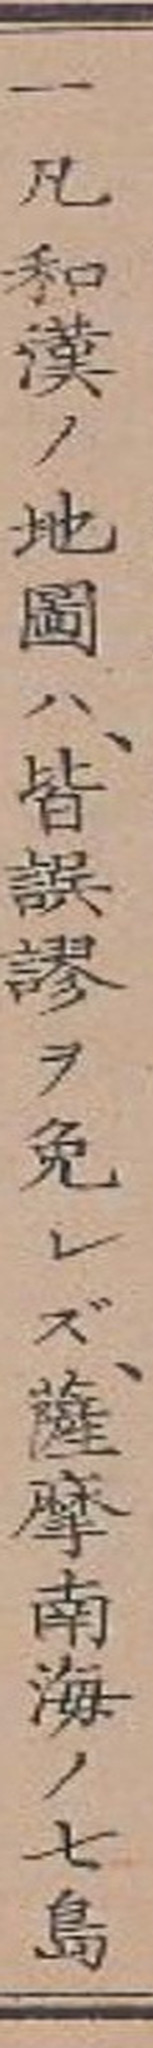一凡和漢ノ地図ハ、皆誤謬ヲ免レズ、薩摩南海ノ七島
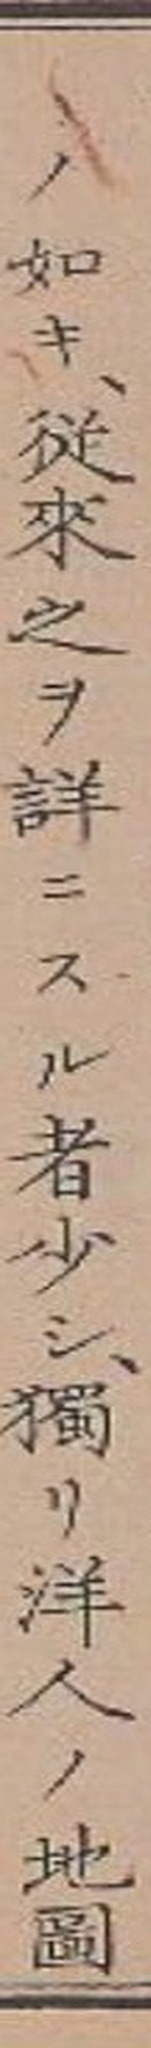ノ如キ、従来之ヲ詳ニスル者少シ、独リ洋人ノ地図
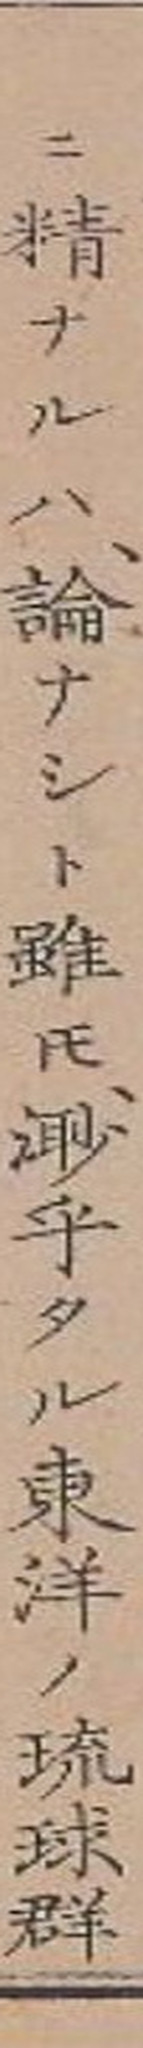ニ精ナルハ、論ナシト雖トモ、渺乎タル東洋ノ琉球群
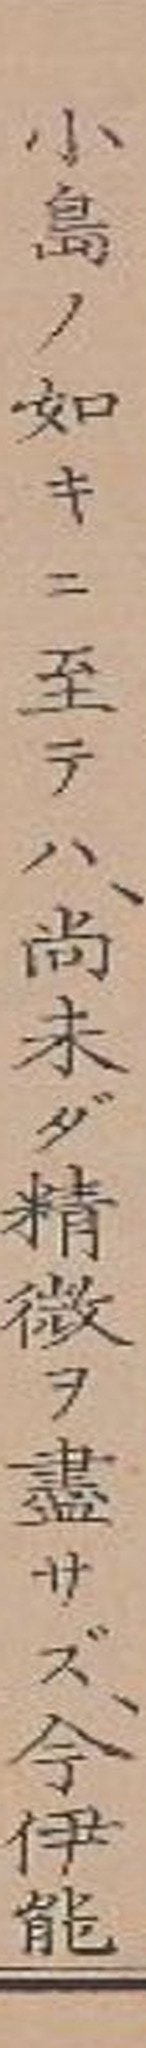小島ノ如キニ至テハ、尚未ダ精微ヲ尽サズ、今伊能
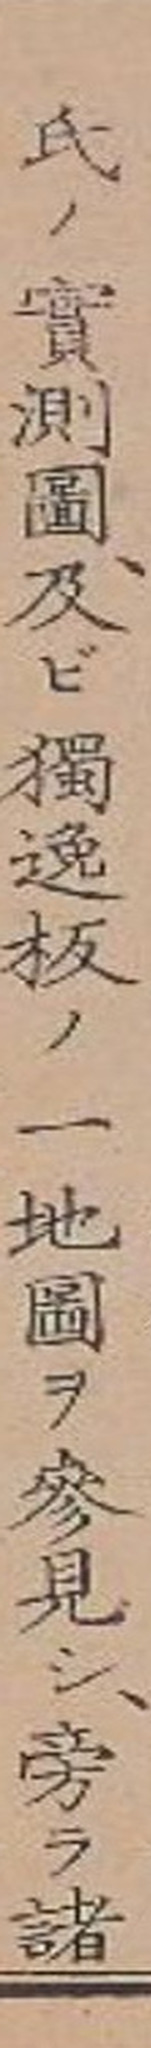氏ノ実測図、及ビ独逸板ノ一地図ヲ参見シ、旁ラ諸
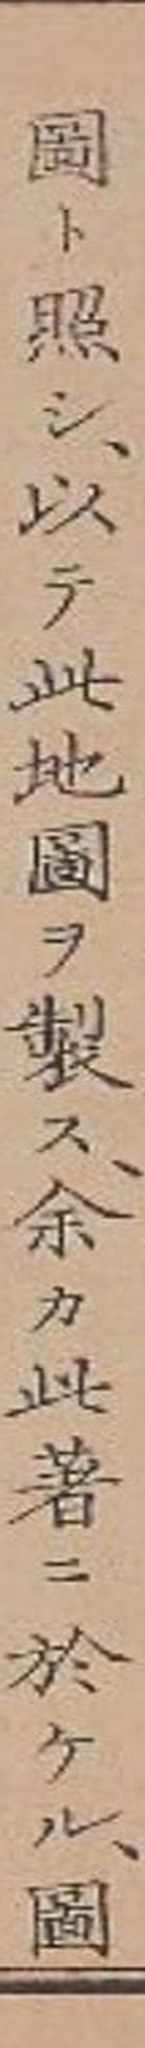図ト照シ、以テ此地図ヲ製ス、余カ此著ニ於ケル、図
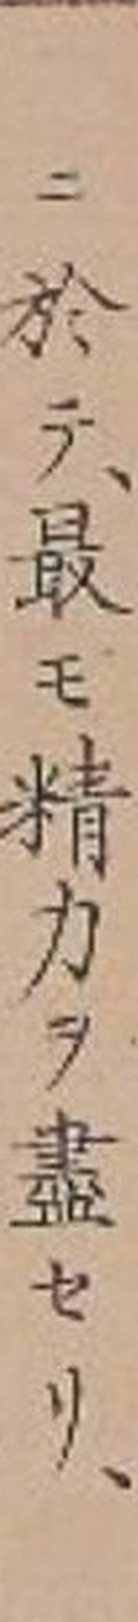ニ於テ、最モ精力ヲ尽セリ、
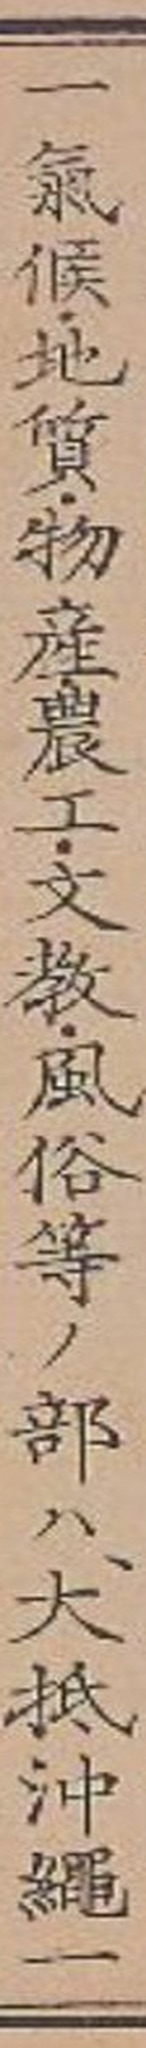一気候・地質・物産・農工・文教・風俗等ノ部ハ、大抵沖縄一
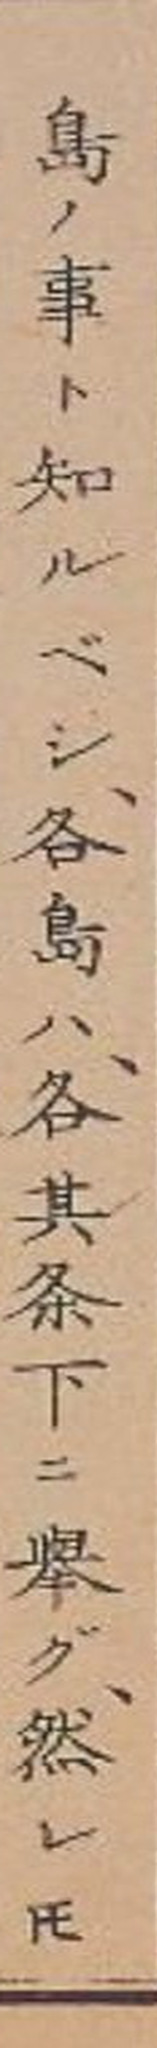島ノ事ト知ルベシ、各島ハ、各其条下ニ挙グ、然レトモ
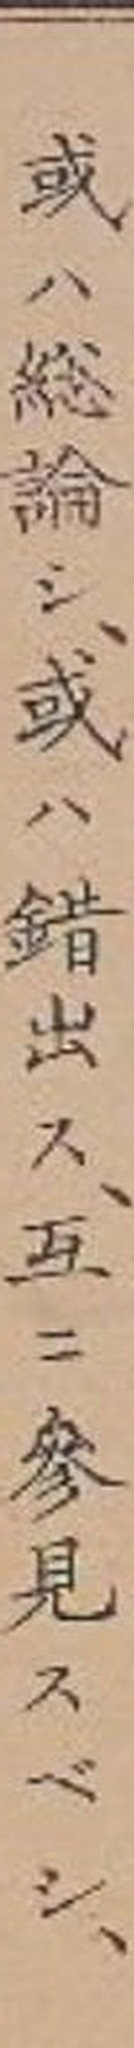或ハ総論シ、或ハ錯出ス、互ニ参見スベシ、
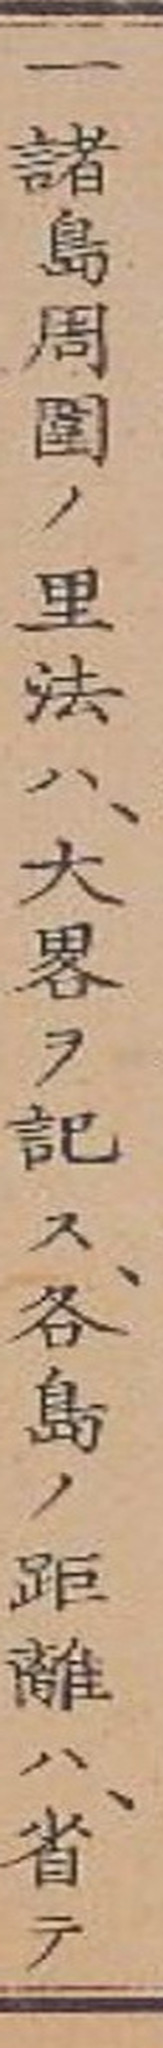一諸島周囲ノ里法ハ、大略ヲ記ス、各島ノ距離ハ、省テ
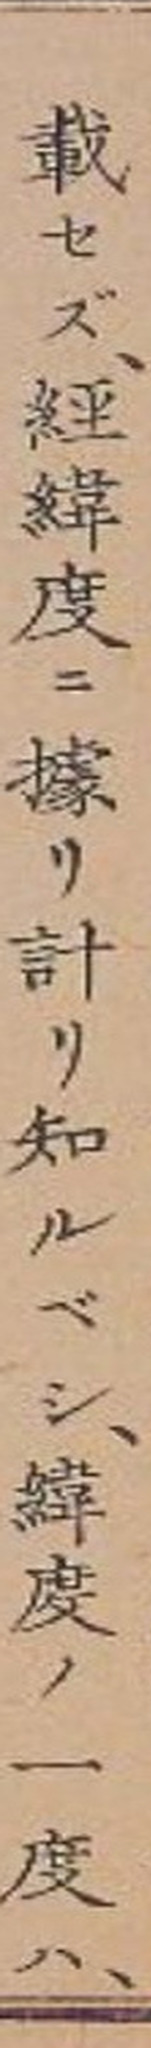載セズ、経緯度ニ拠リ計リ知ルベシ、緯度ノ一度ハ、
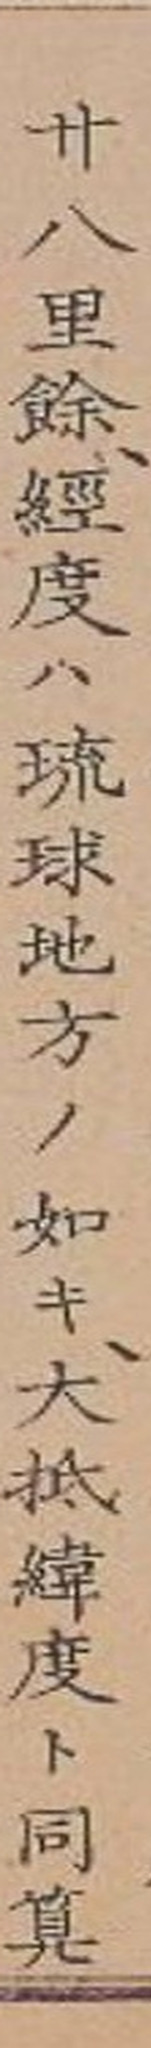廿八里余、経度ハ琉球地方ノ如キ、大抵緯度ト同算
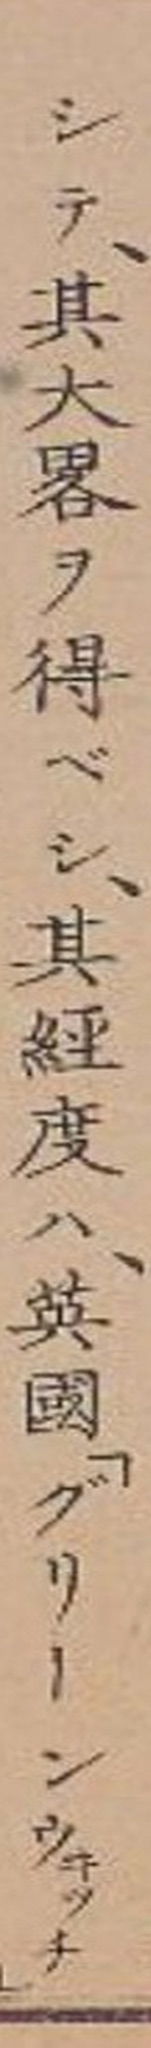シテ、其大略ヲ得ベシ、其経度ハ、英国「グリーンウヰッチ」
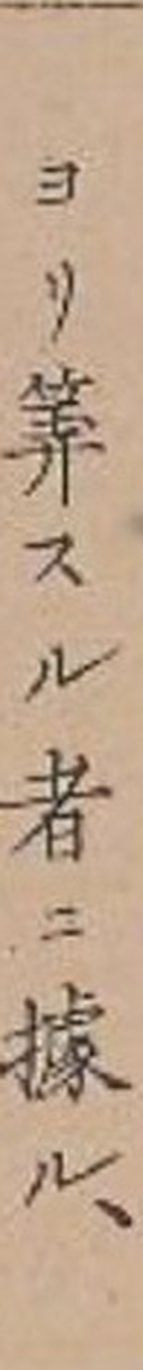ヨリ算スル者ニ拠ル、
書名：琉球新誌 巻上
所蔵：University of the Ryukyus Library
